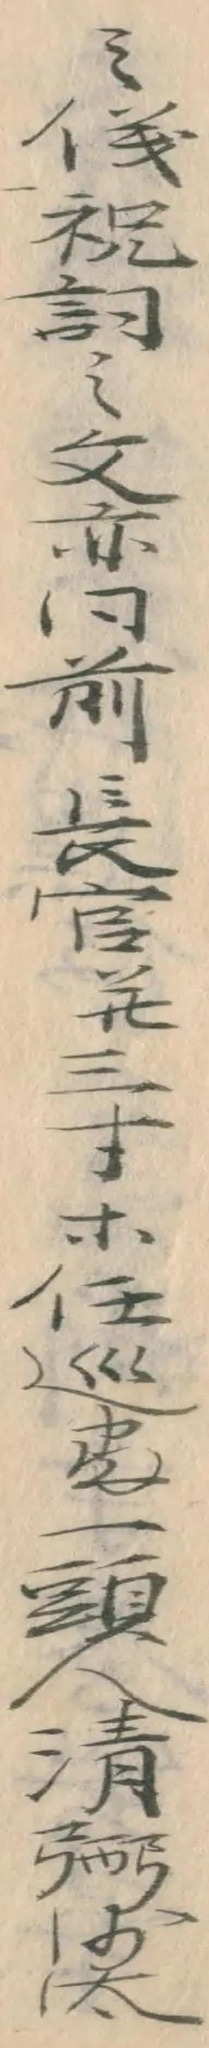之儀祝詞之文亦同前長官并三寸等任巡番一頭人清弼沙汰

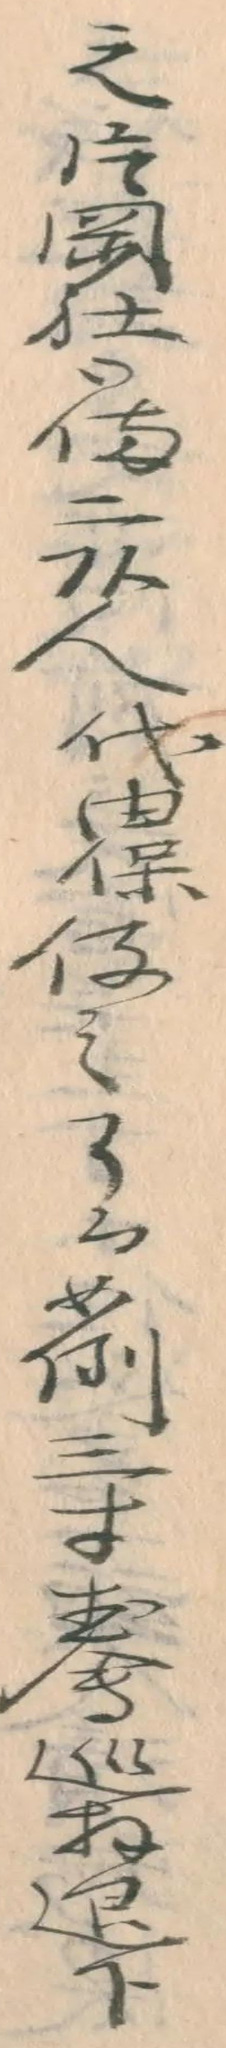之片岡社御備二頭人代由保役之了而如例三寸直會巡拝退下
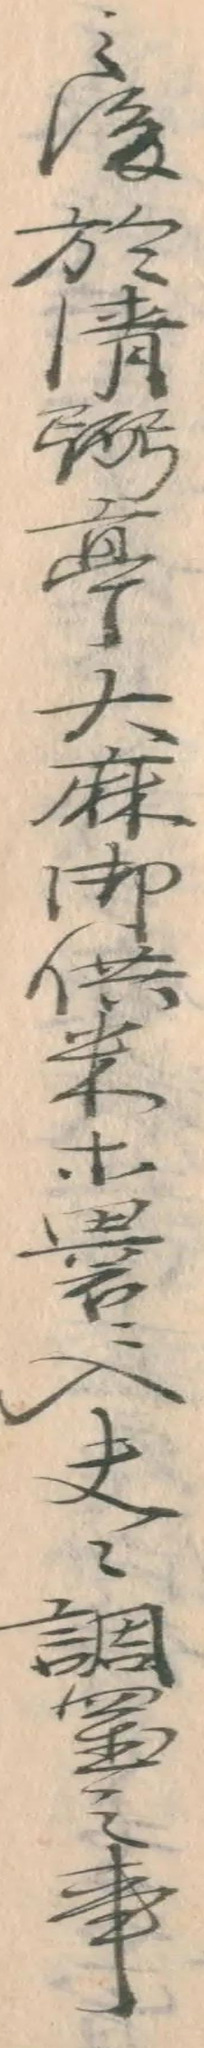之後於清弼亭大麻御供米等褁ニ入夫〻調置之事
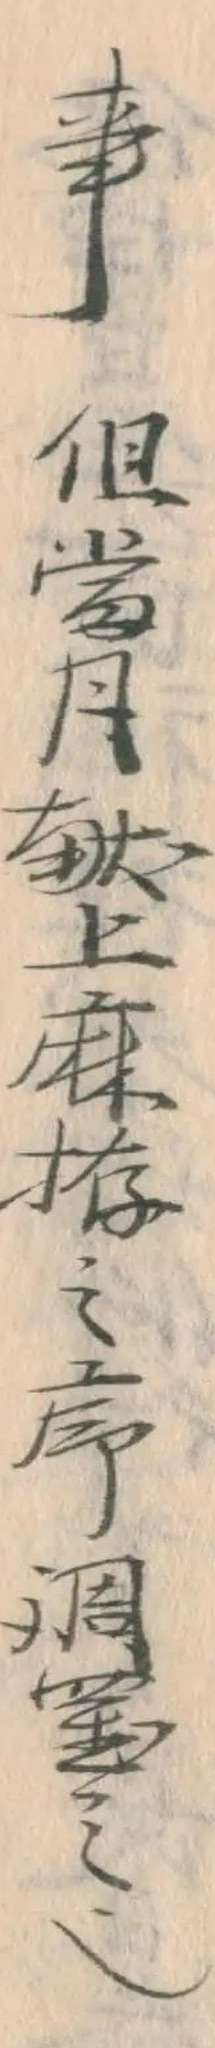事但當月献上麻拵之序調置之也
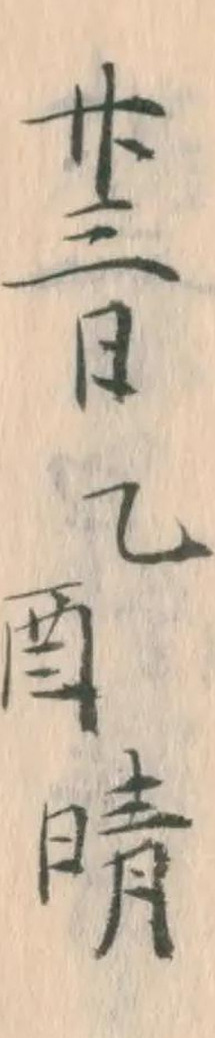廿三日乙酉晴
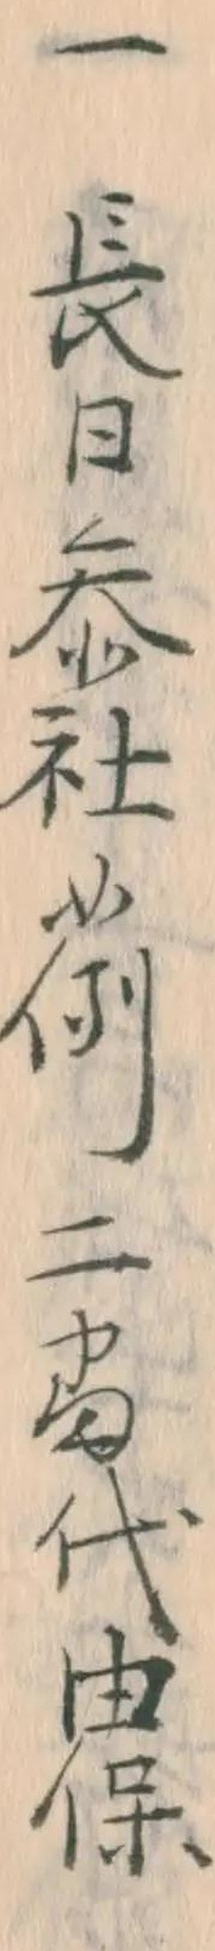一長日参社如例二番代由保
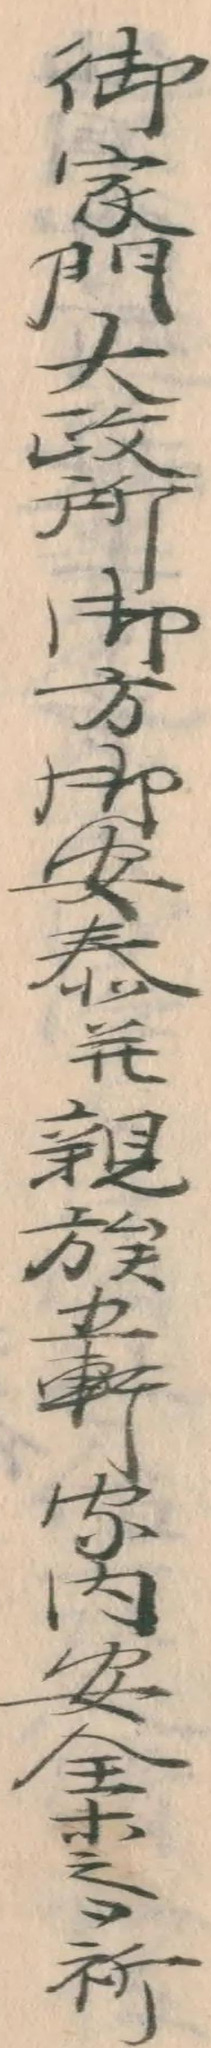一御家門大政所御方御安泰并親族五軒家内安全等之御祈
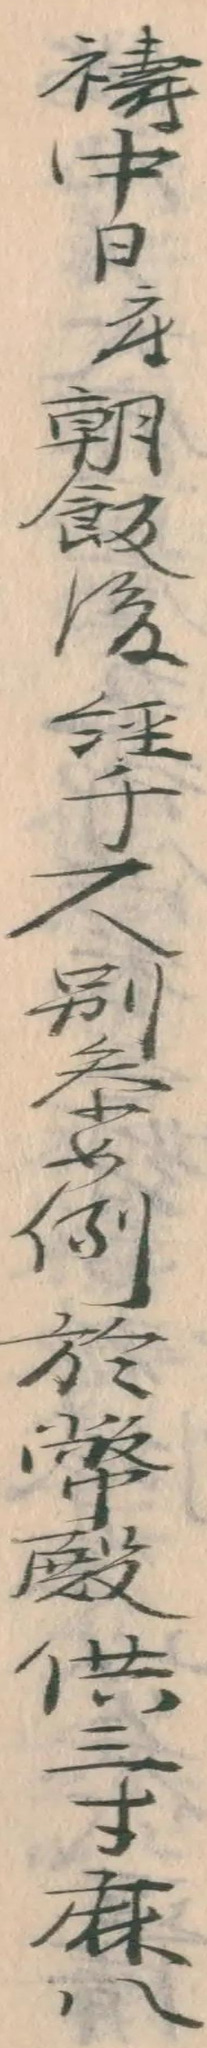祷中日ニ付朝飯後経千一人別参如例於幣殿供三寸麻八
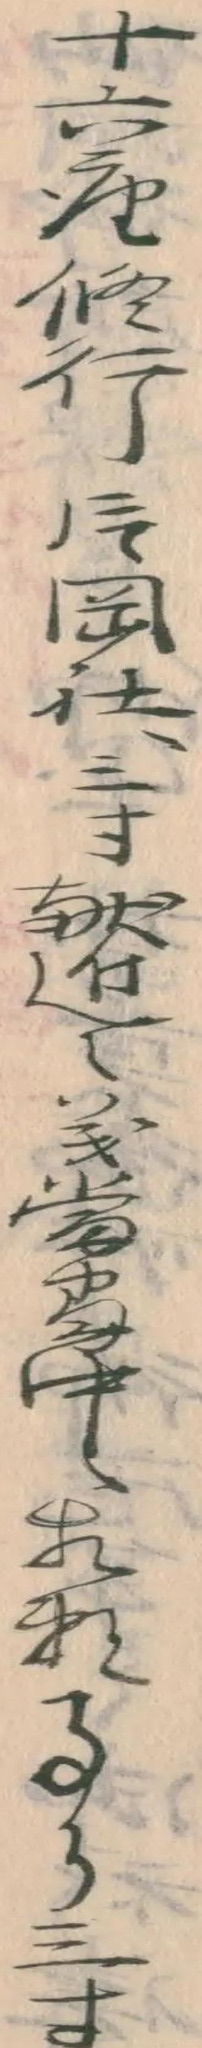十六座修行片岡社へ三寸献進之義當番中へ相頼事了三寸
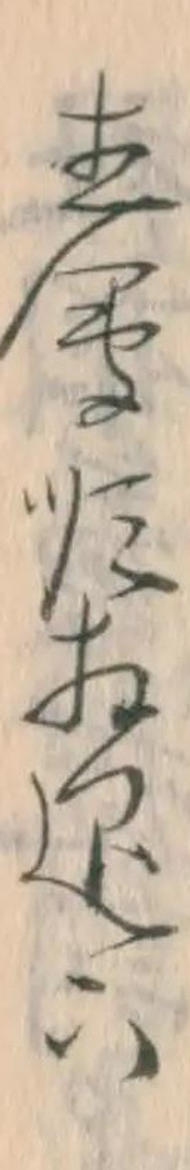直會順相退候
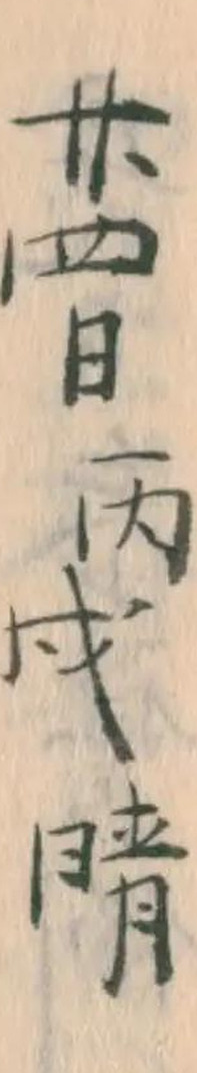廿四日丙戌晴
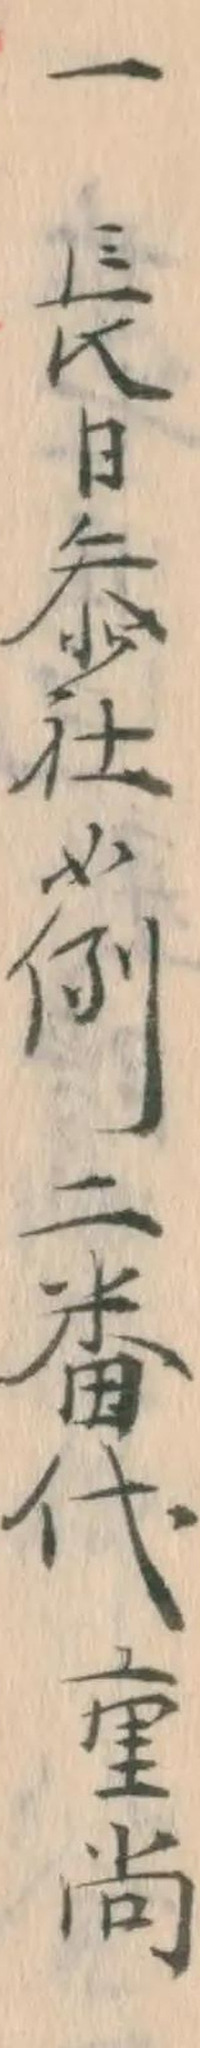一長日参社如例二番代重尚
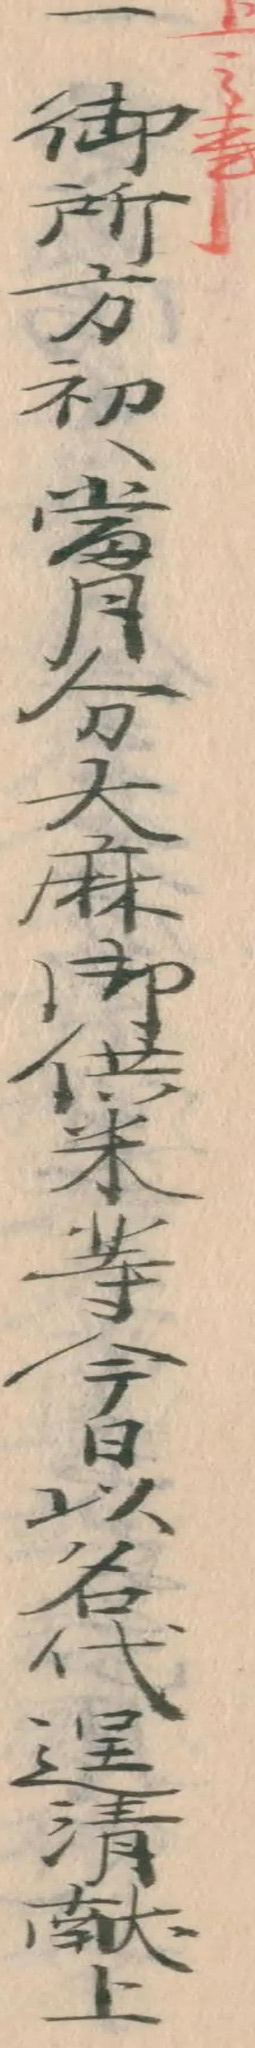一御所方初へ當月分大麻御供米等今日以名代逞清献上
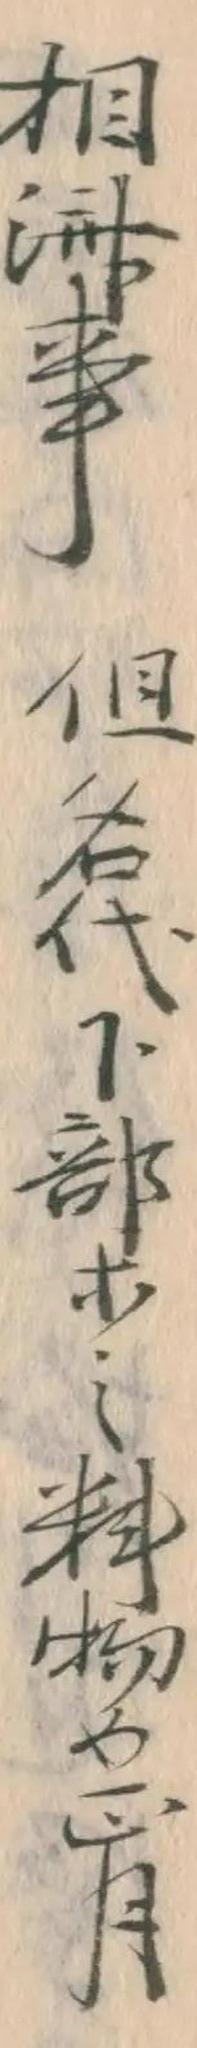相済事但名代下部等之料物如正月
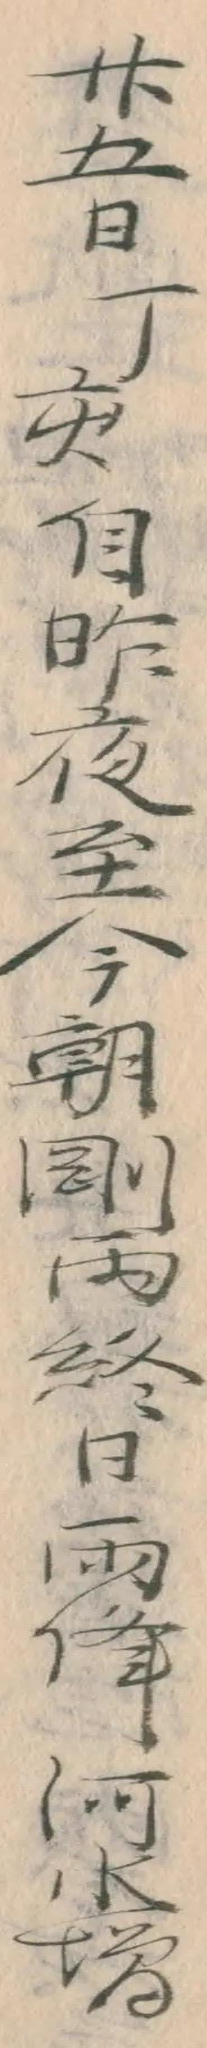廿五日丁亥自昨夜至今朝剛雨終日雨降河水増
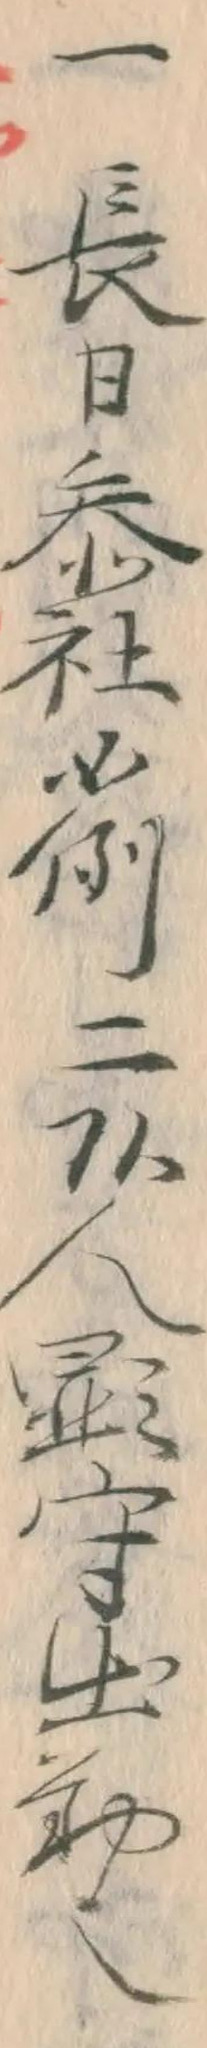一長日参社如例二頭人顕守出勤也
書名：賀茂社記録. 第73冊
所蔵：国立国会図書館 National Diet Library, JAPAN
